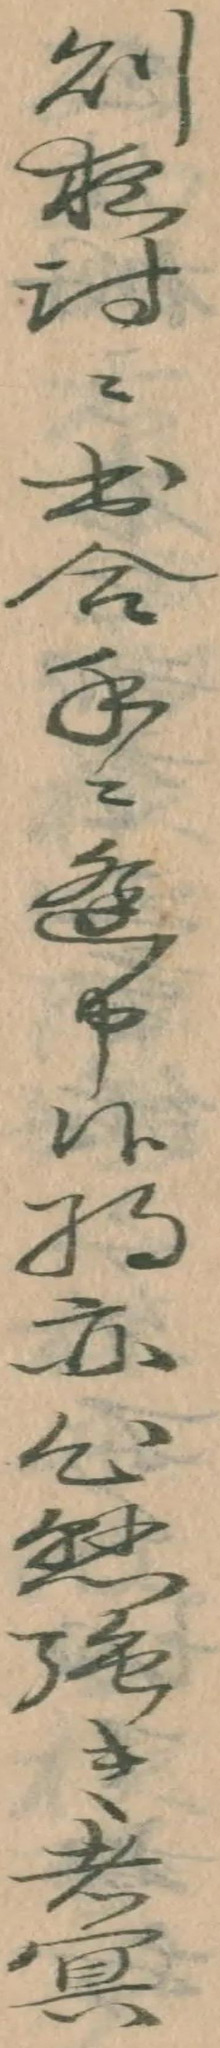則夜討に出合手に逢申候将亦心懸強き者冥
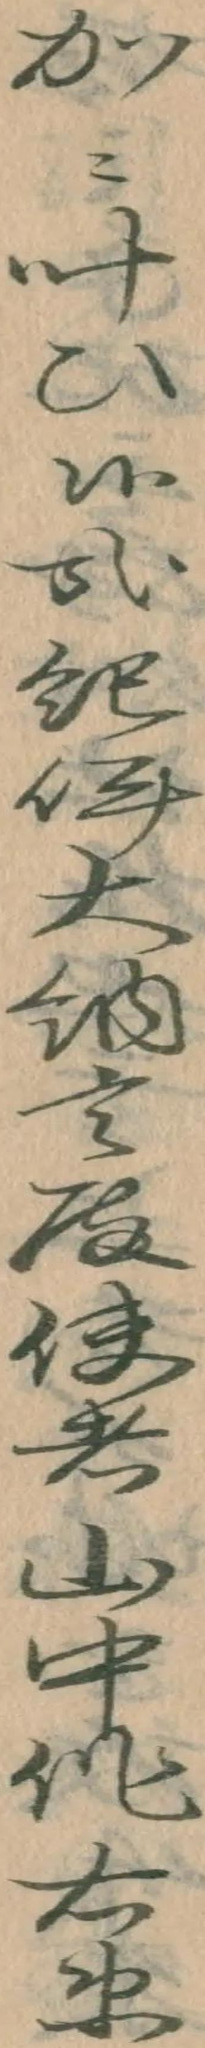加に叶ひ候哉紀伊大納言殿使者山中作右衛
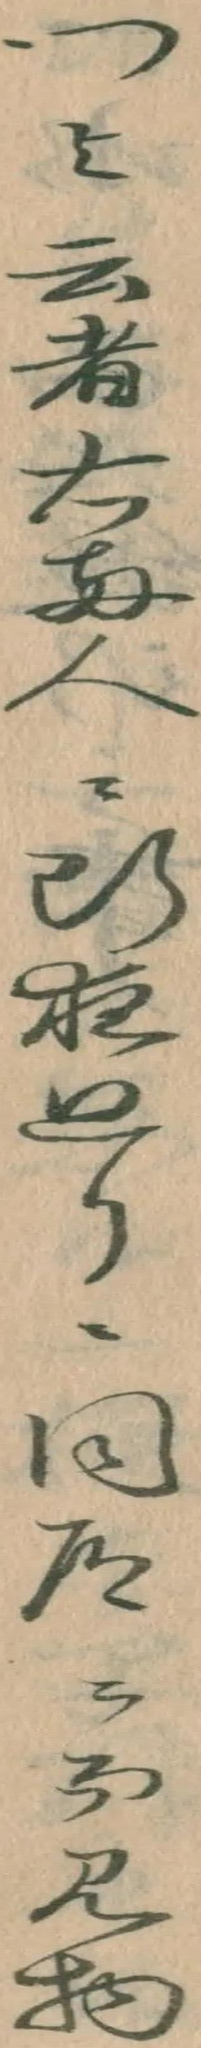門与云者右両人に断夜廻りに同道に而見物
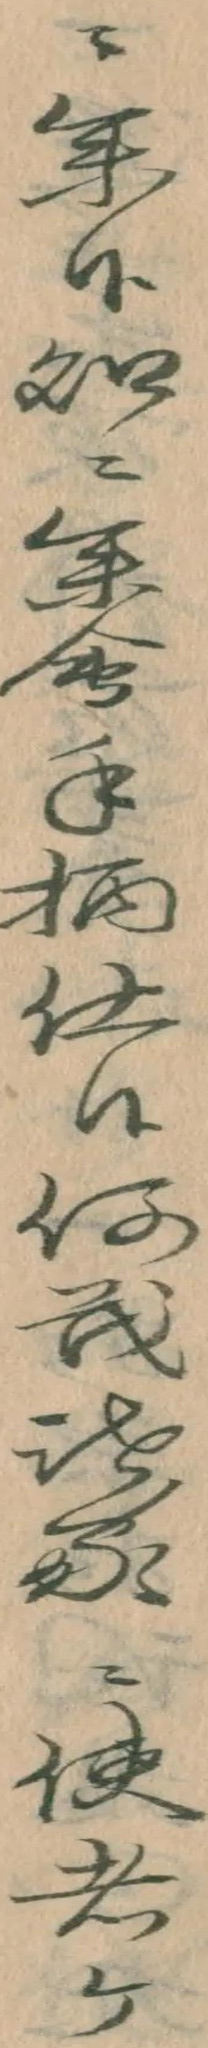に参候処に参会手柄仕候何茂諸家に使者け
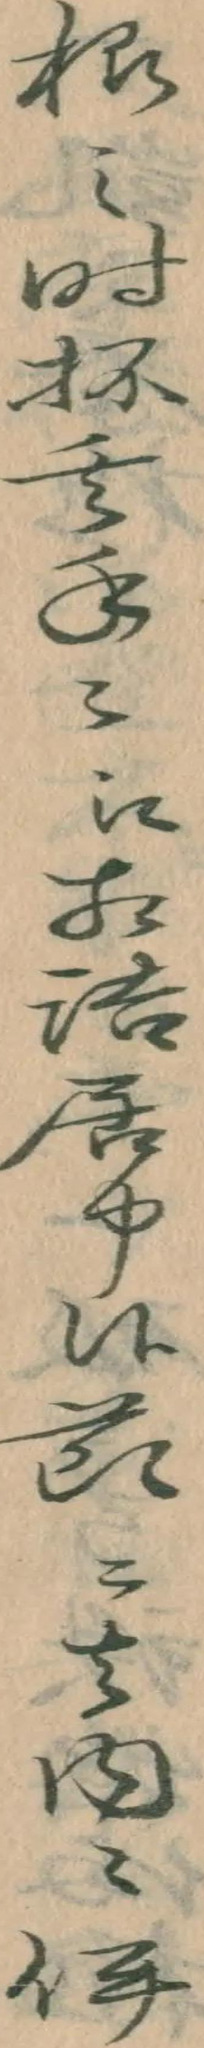様之時抔其手々江相詰居申候節に者内々伊
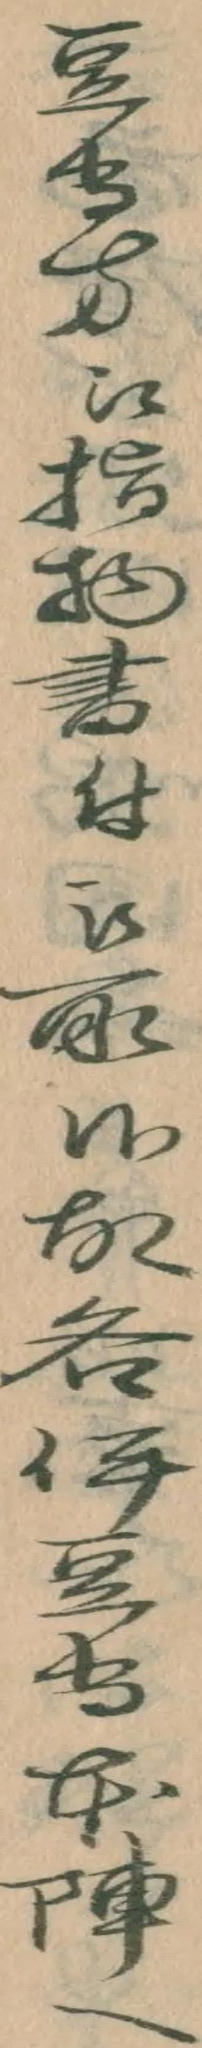豆守方江指物書付被取候故各伊豆守本陣へ
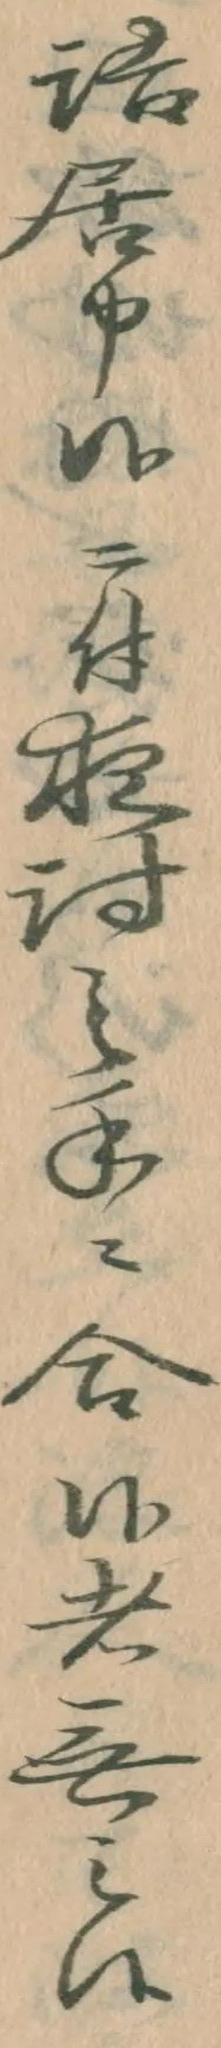詰居申候に付夜討之手に合候者無之候

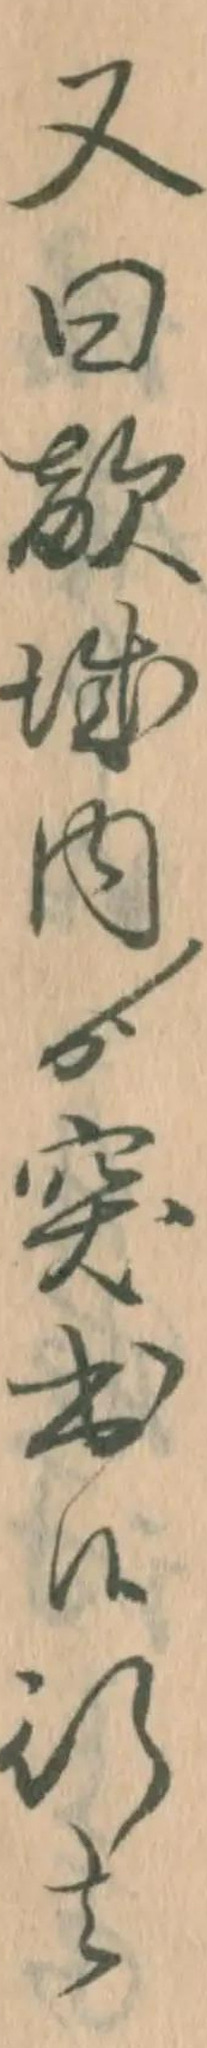又曰敵城内ゟ突出候行者
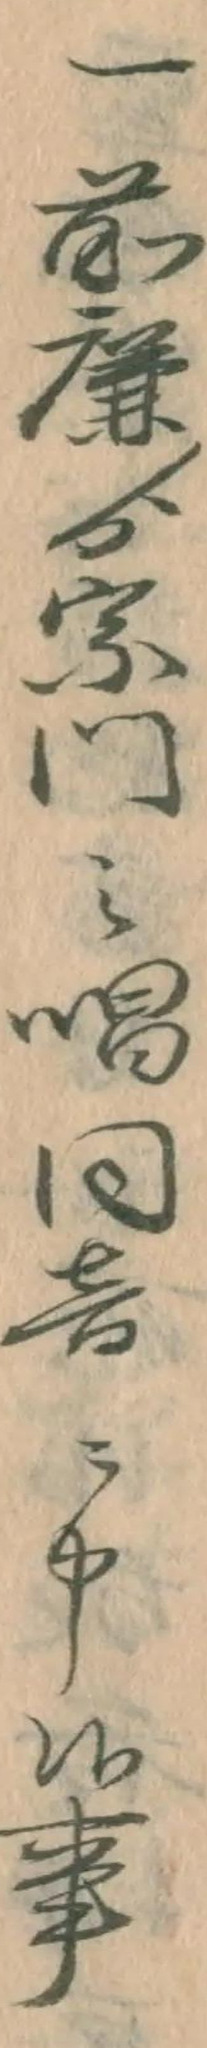一前廉ゟ宗門之唱同音に申候事
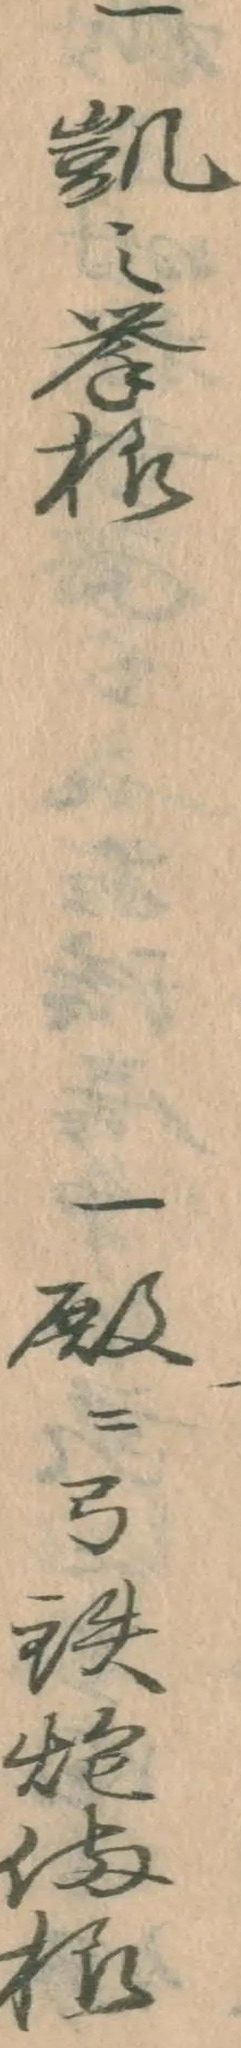一凱之挙様一殿に弓鉄炮備様
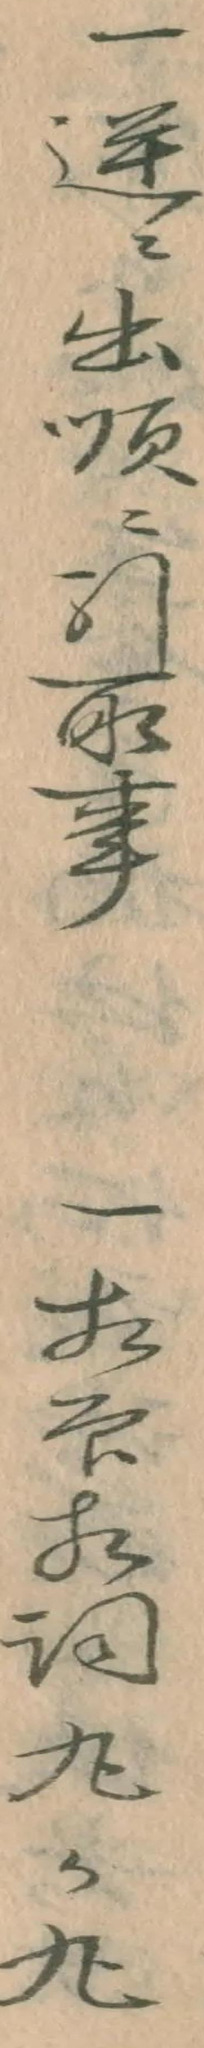一逆に出順に引取事一相印相詞丸か丸
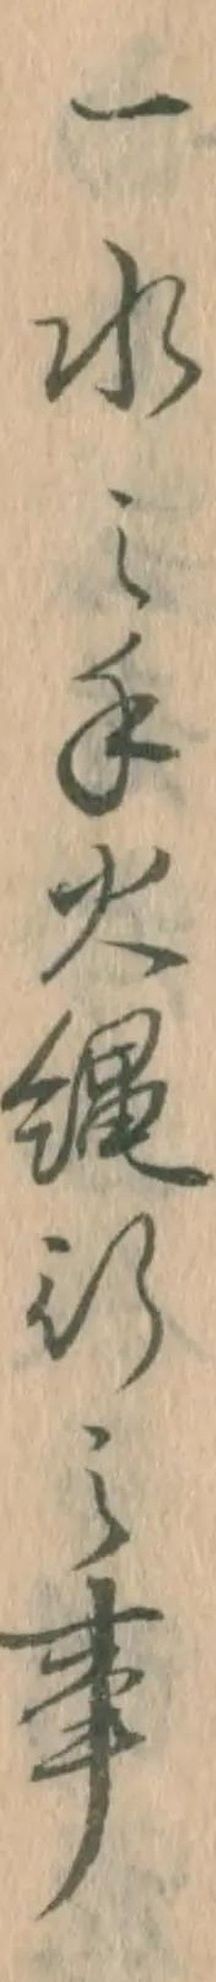一水之手火縄行之事
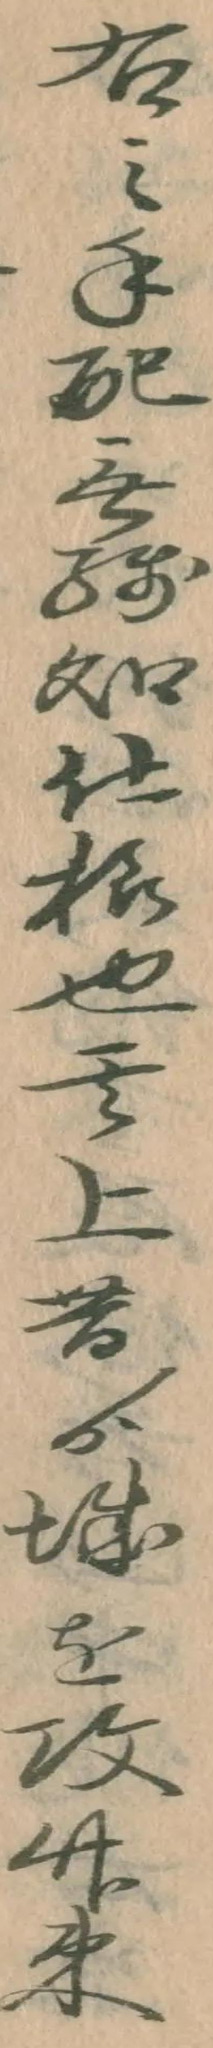右之手配無騎処仕様也其上昔ゟ城を攻竹束
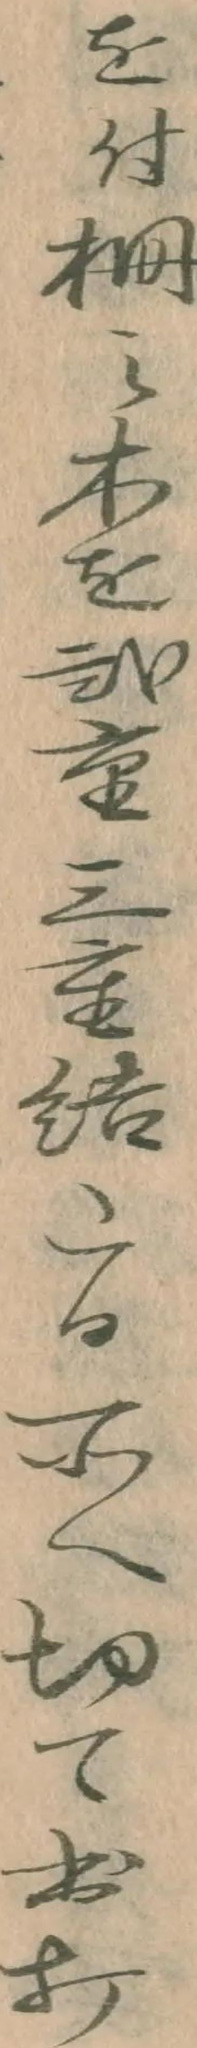を付柵之木を弐重三重結たる所へ切て出打
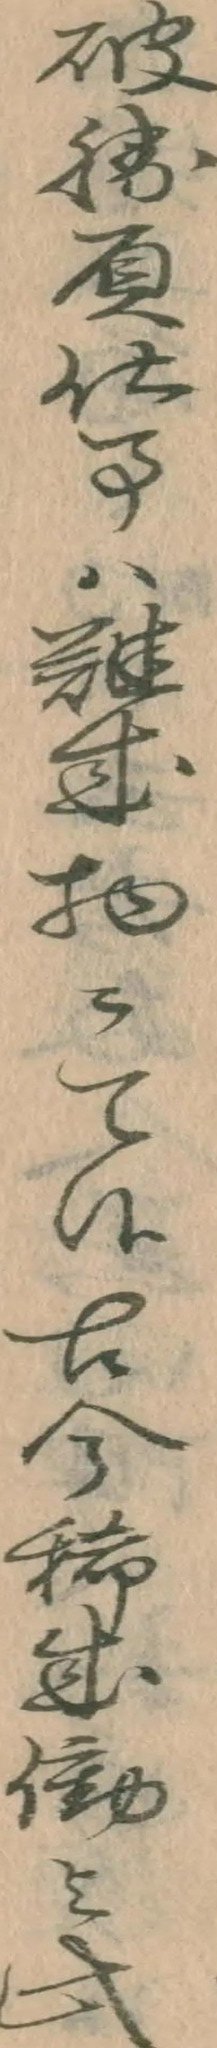破勝負仕事は難成物にて候古今稀成働与此
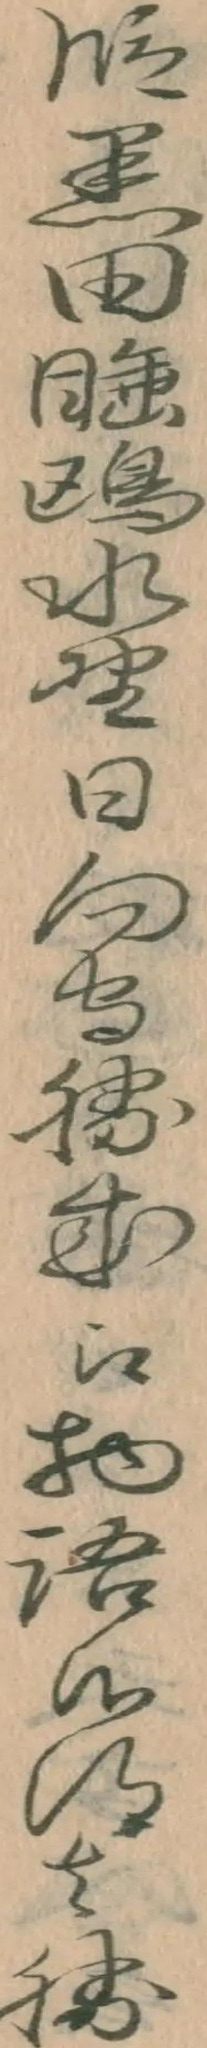段黒田睡鴎水野日向守勝成江物語候得者勝
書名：切支丹御退治記 49巻. [7]
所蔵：国立国会図書館 National Diet Library, JAPAN
